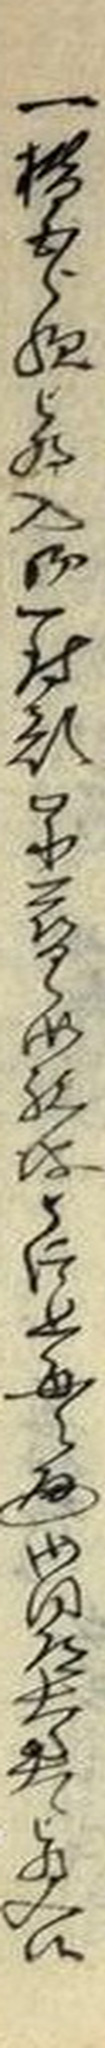一揩五郎様被為入御対顔歳暮御祝儀被仰上毎之通御同道大奥被為入候
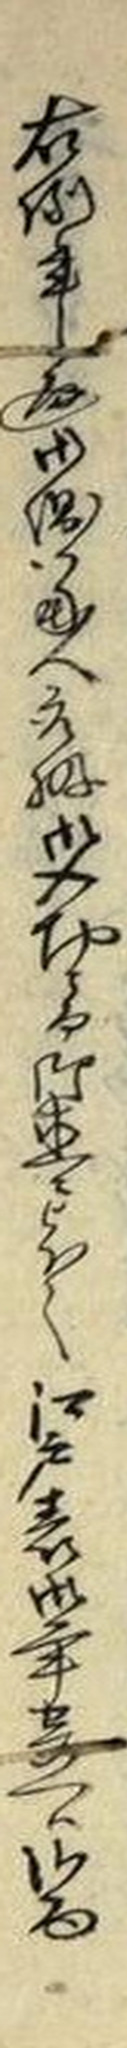右例年之通御側御用人取扱御〆切ニ而御直々被下之江戸表御年寄へハ弐百

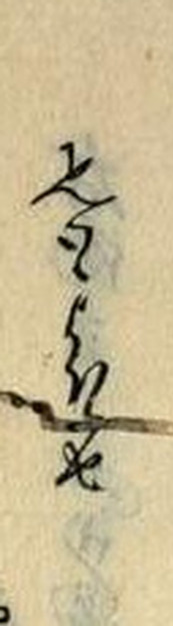疋ツゝ被下候由
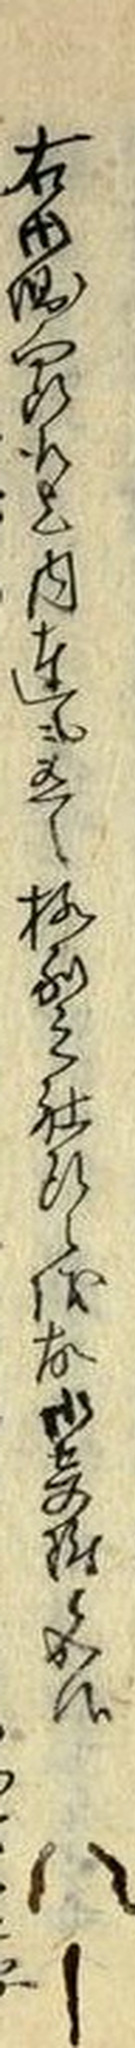右御側向頭取迄内達も有之格別之社頭候儀故御寄附被成候
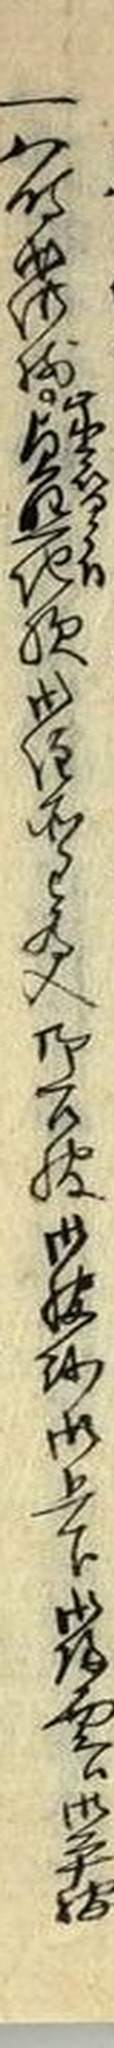一八時御供揃歳暮ニ付貞照院様御住所へ被為入御召服御服紗御上下御帰殿ハ御平服
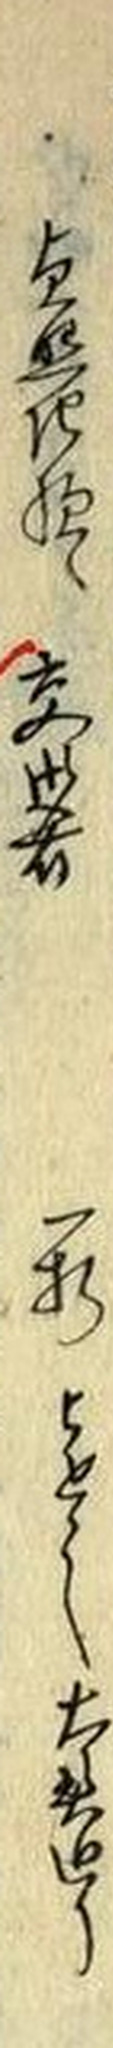貞照院様へ交御肴一折被進之大奥廻り
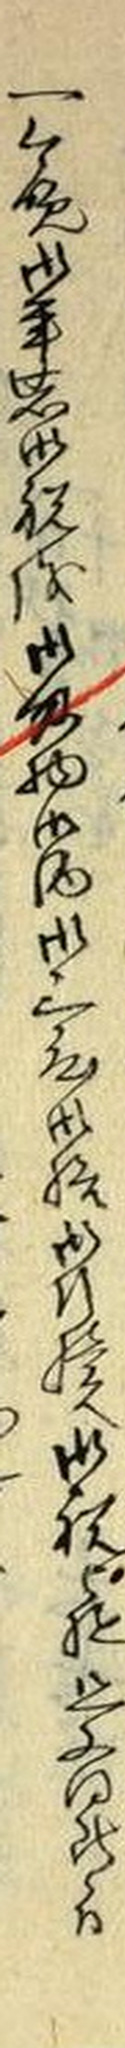一今晩御年忘御祝儀御吸物御酒御三度御膳御引続御祝被遊且又同断ニ付
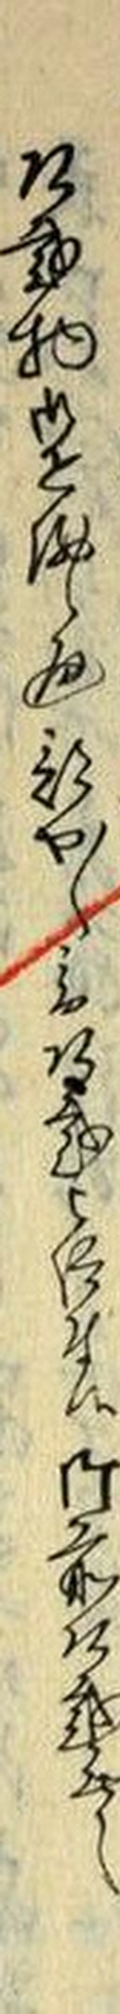頂戴物御近例之通部や〳〵ニ而頂戴被仰付候御前頂戴無之
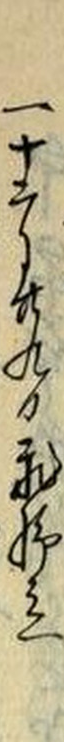一十二月廿九日飛脚立
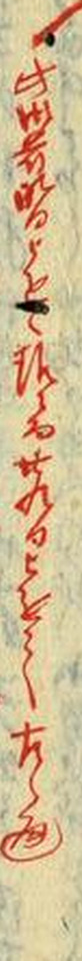此御肴昨日被進之趣ニ而廿九日被進之左之通
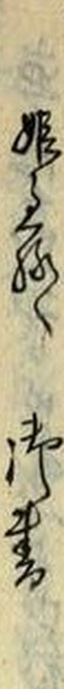姫君様へ御書
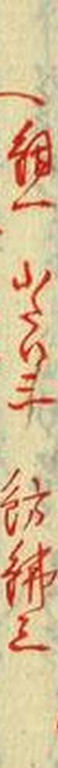鯛一小たい三魴鮄三
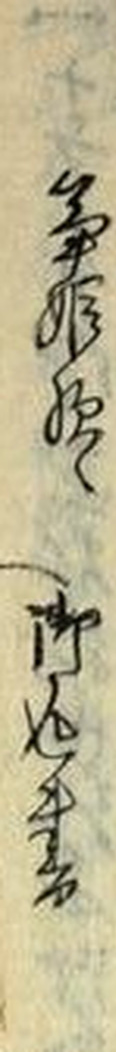箏姫様へ御返書
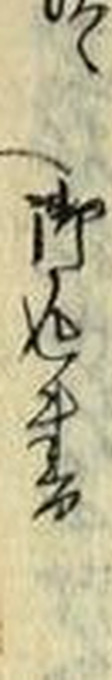御返書
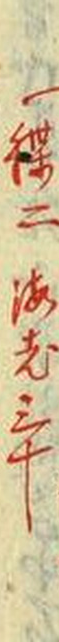鰈二海老三十
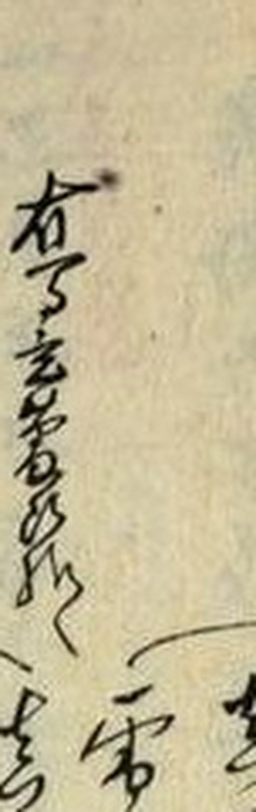有馬玄蕃頭様へ
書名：少傅日録抄（斉承付側向頭取日記、在国）
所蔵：福井県文書館 Fukui Prefectural Archives
